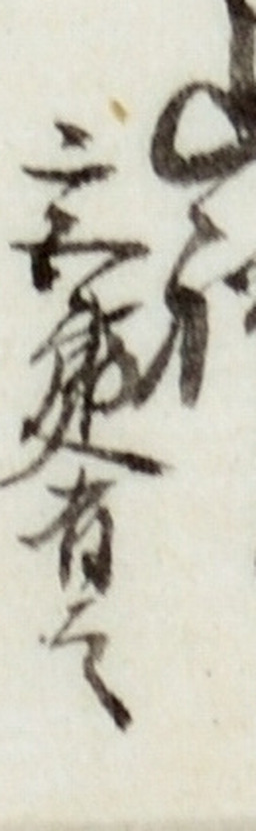宮建有之
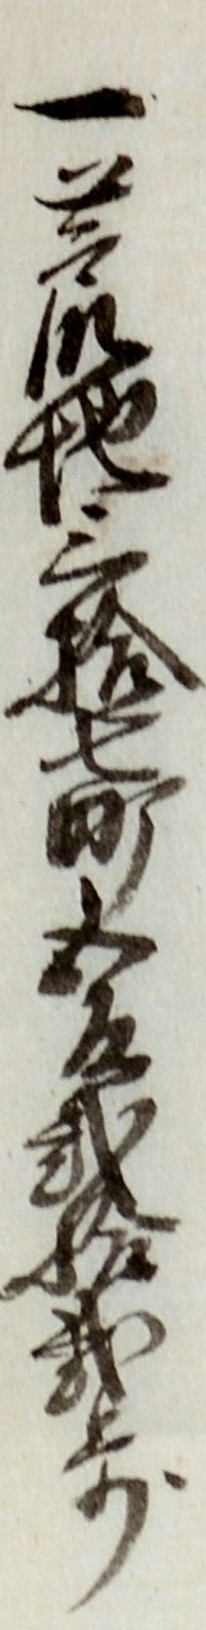一荒地三拾七町五反弐拾弐歩村中
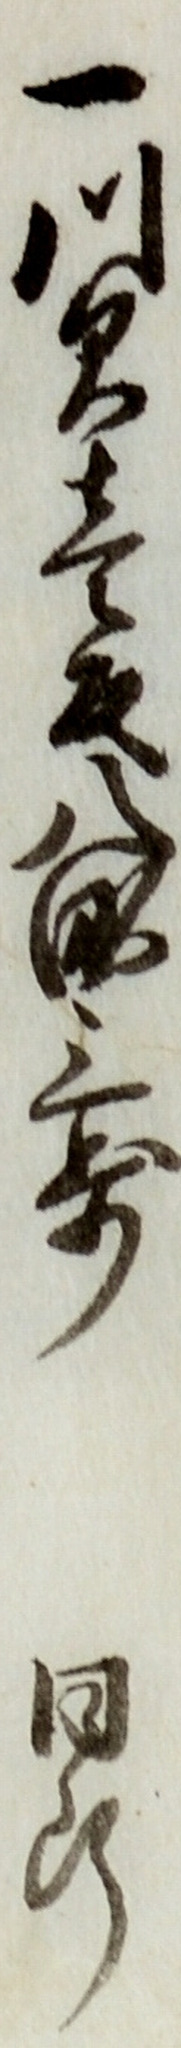一川欠壱反八畝三歩同断

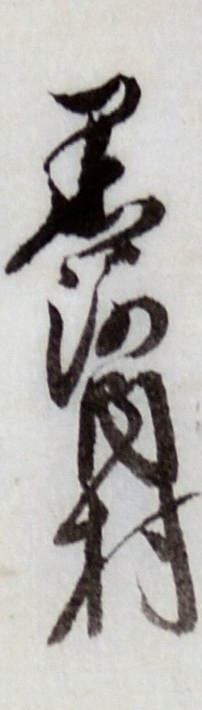黒河内村
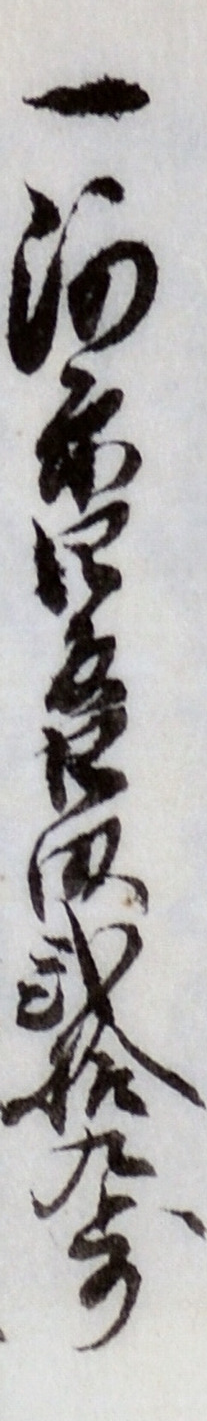一河原四反四畝弐拾九歩
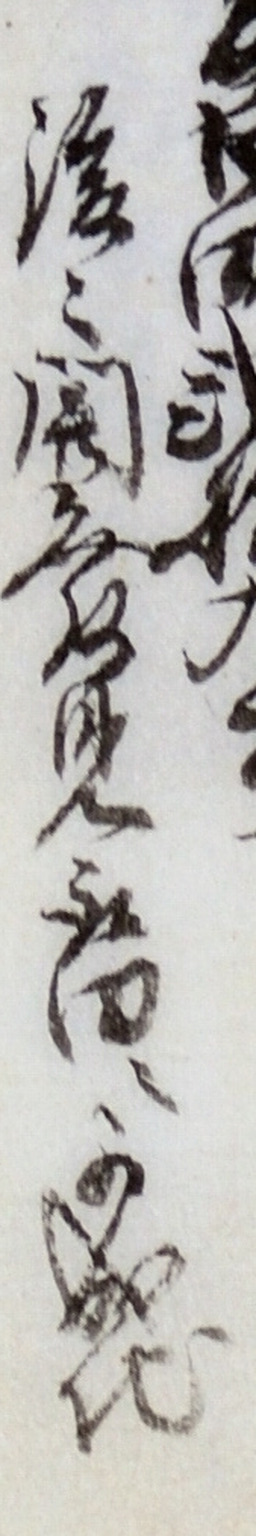後々開発見取田ニ可成地
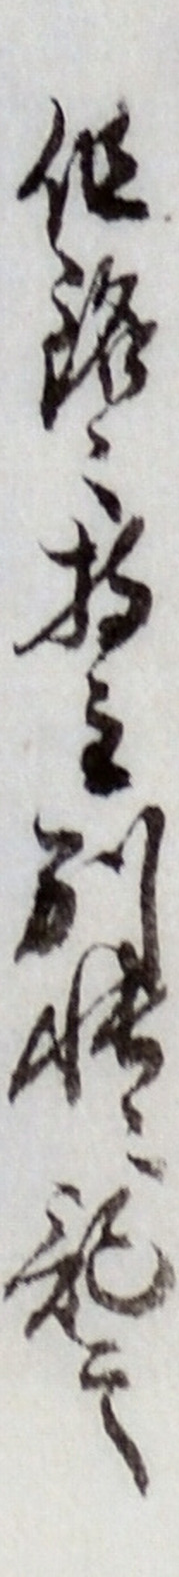但銘々持主別帳ニ記之
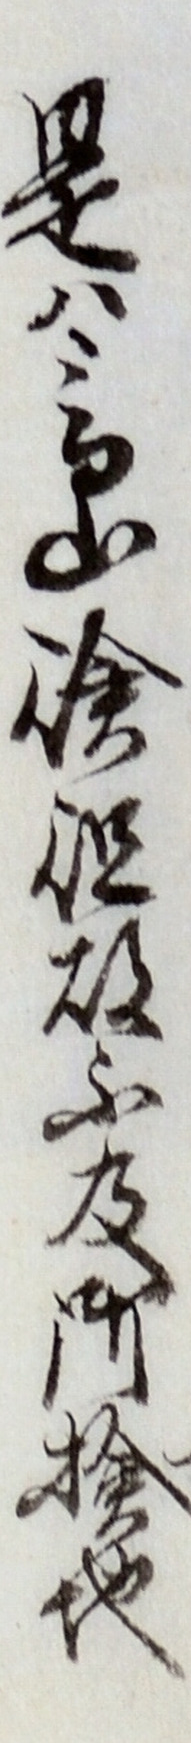是ハ高山嶮岨故不及御検地
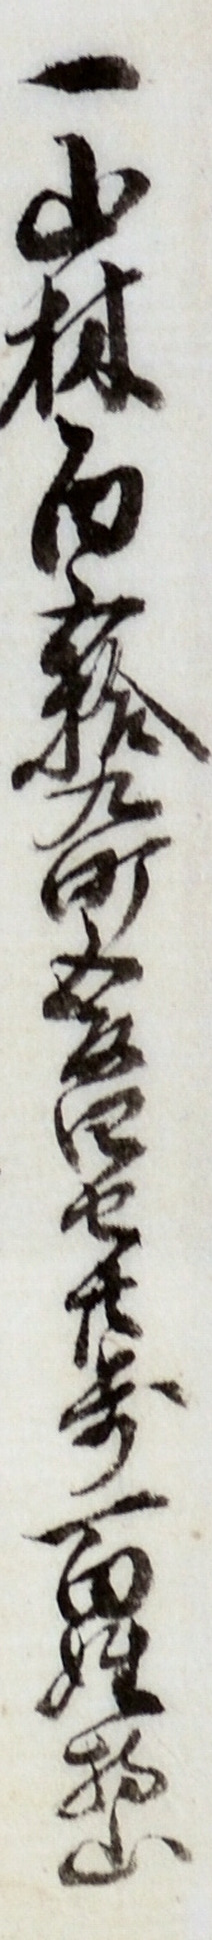一山林百五拾九町五反四セ廿歩百姓持山
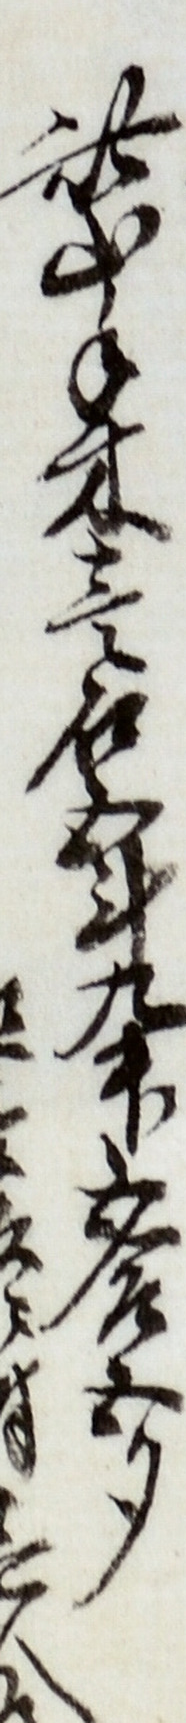此山手米壱石五斗九升五合五勺
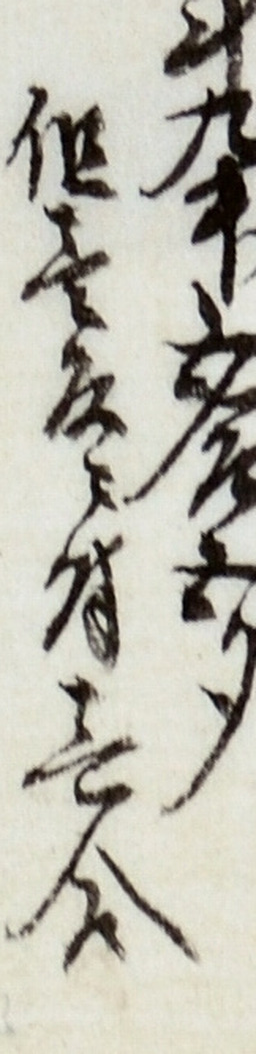但壱反ニ付壱合
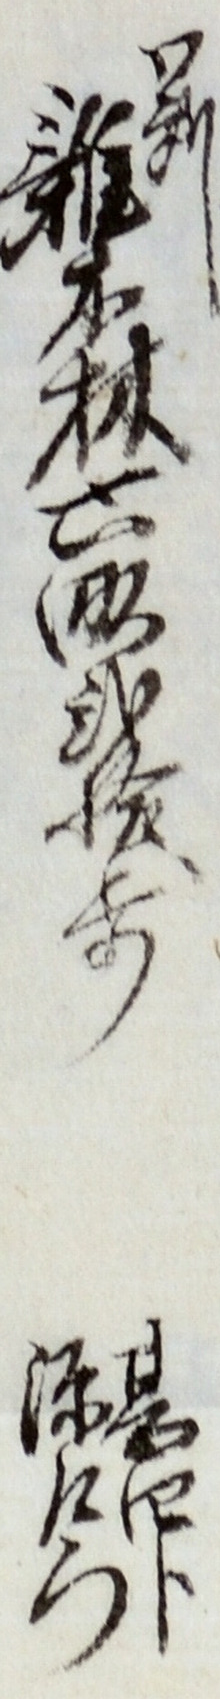雑木林六畝歩源左衛門
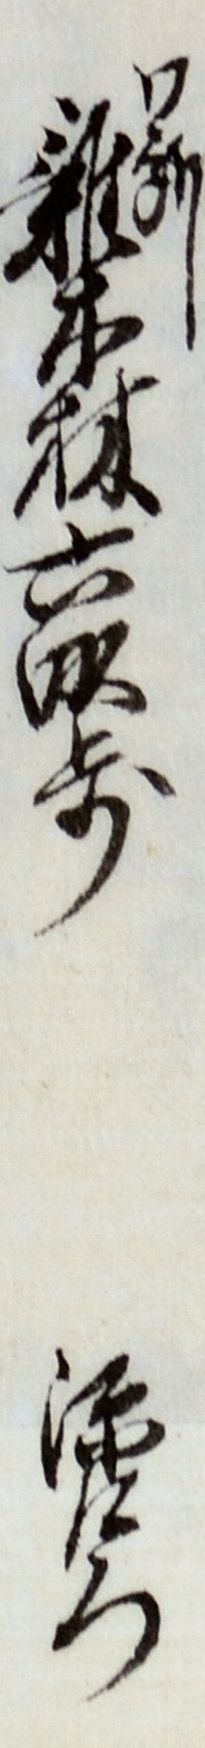雑木林六畝歩源左衛門
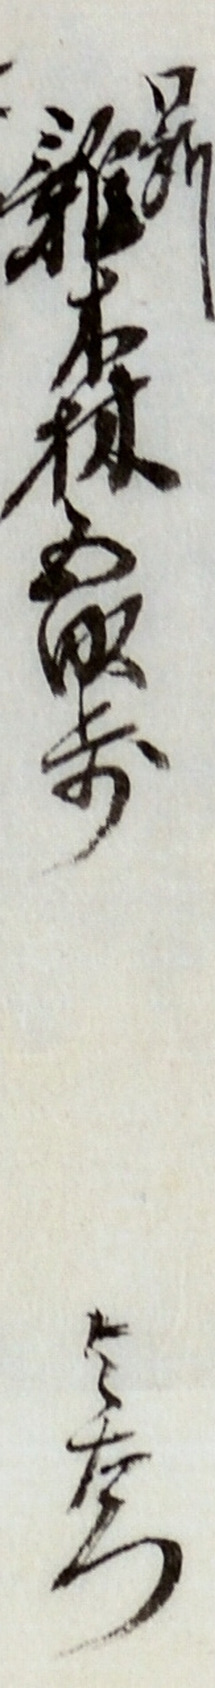雑木林五畝歩与右衛門

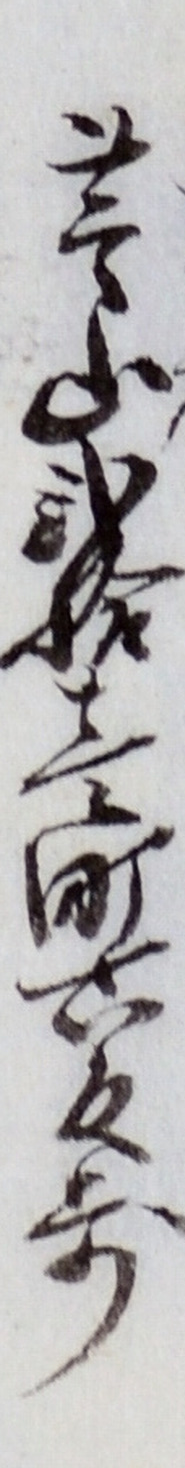芝山弐拾壱町六反歩村中
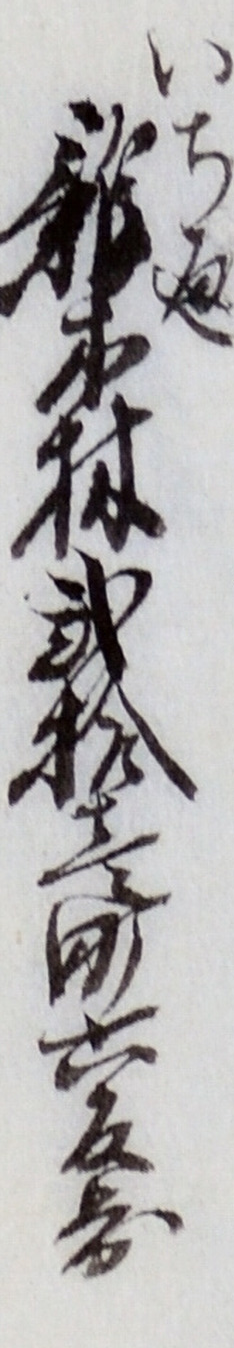雑木林弐拾壱町六反歩同断
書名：御領分中山林社地手控
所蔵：伊那市立高遠町図書館・合同会社AMANE
